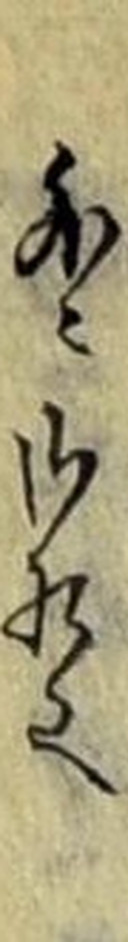外に弐拾匁
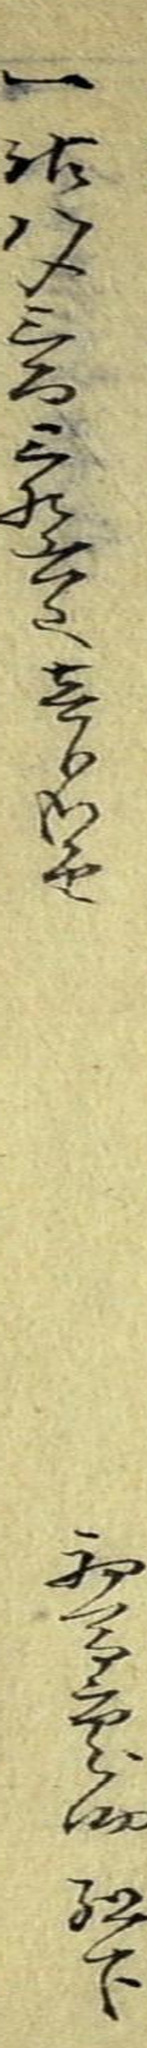一銀八貫三百三拾六匁壱分弐厘初冨市郎助組下
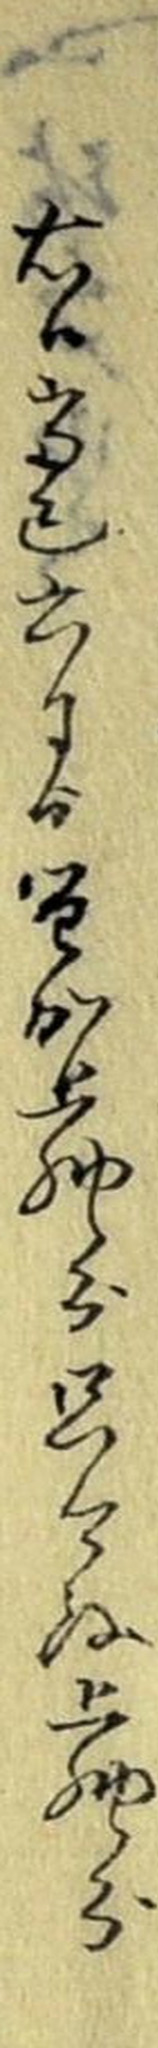右は当巳六月ゟ冥加上納之分只今致上納分

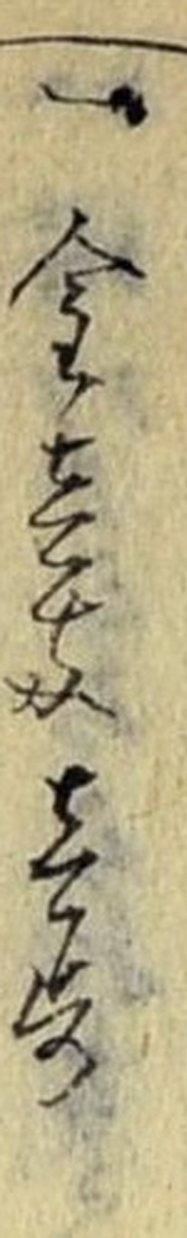一金壱両壱歩
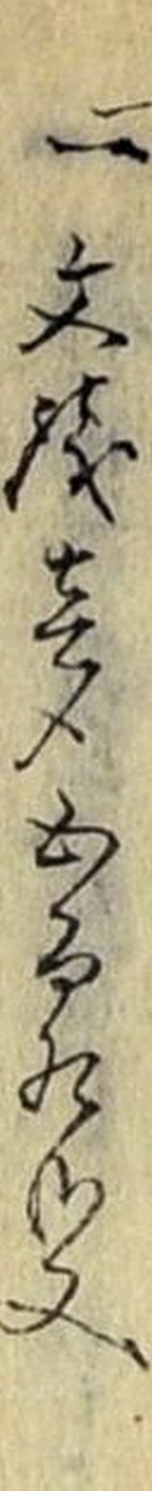一文銭壱貫五百拾弐文
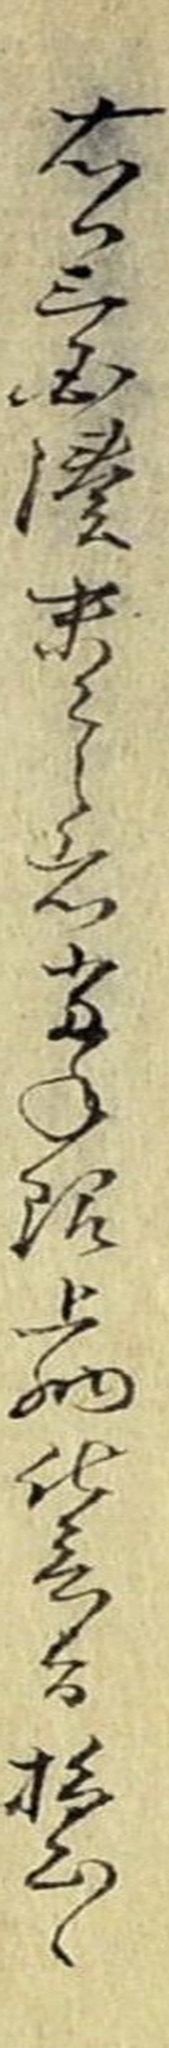右は三国湊末々之者当年銀上納仕度旨指出之
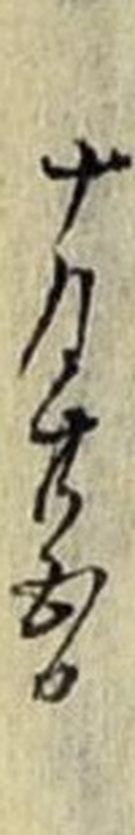十月廿五日
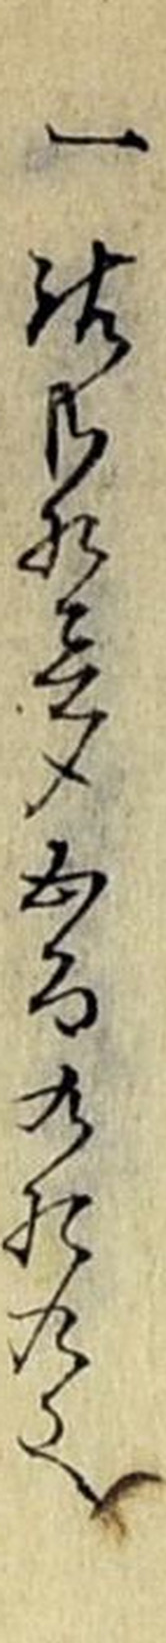一銀弐拾壱貫五百九拾九匁上領
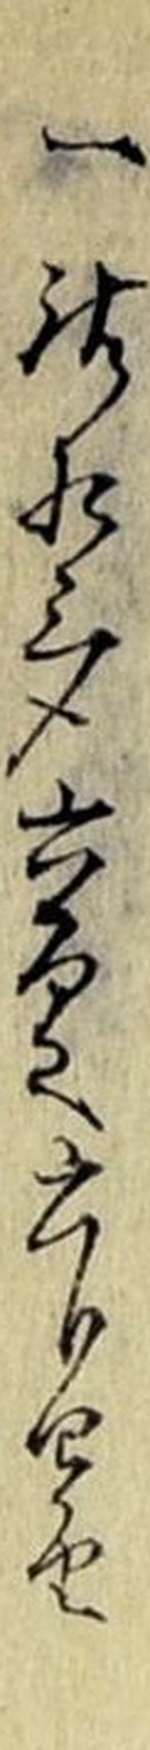一銀拾三貫六百匁六分四厘中領
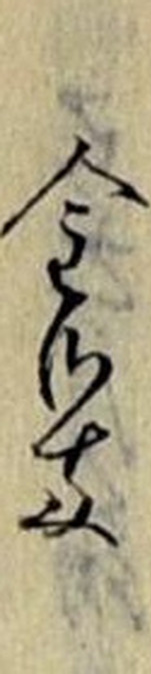金弐両
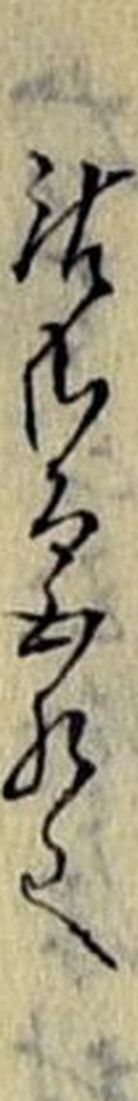銀弐百五拾匁
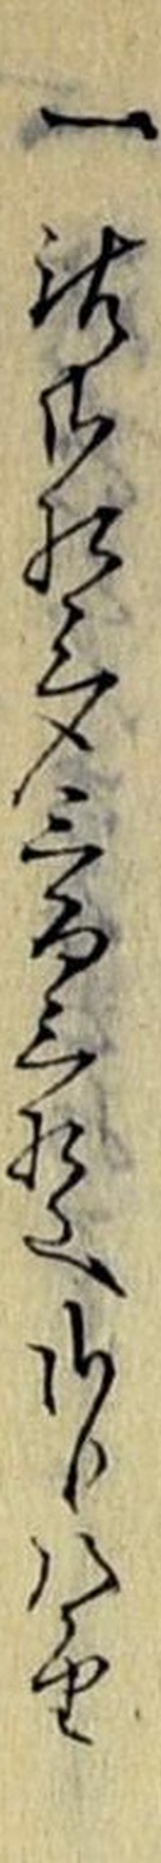一銀弐拾三貫三百三拾匁弐分八厘下領
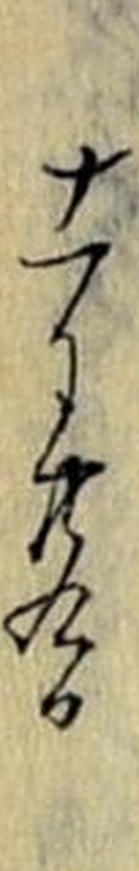十一月廿九日
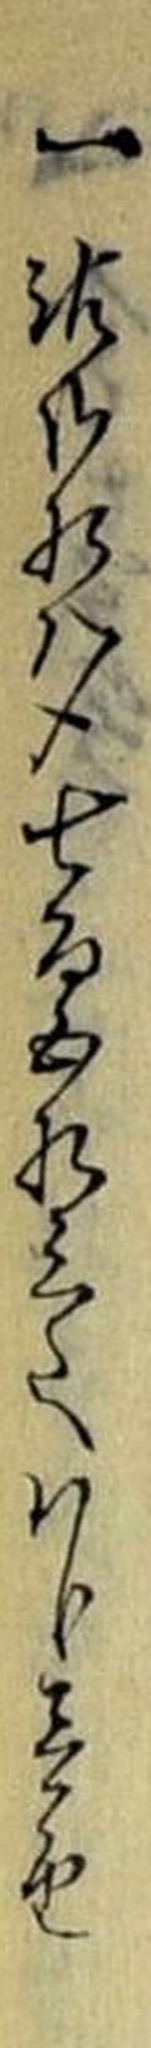一銀弐拾八貫七百五拾三匁弐分壱厘上領
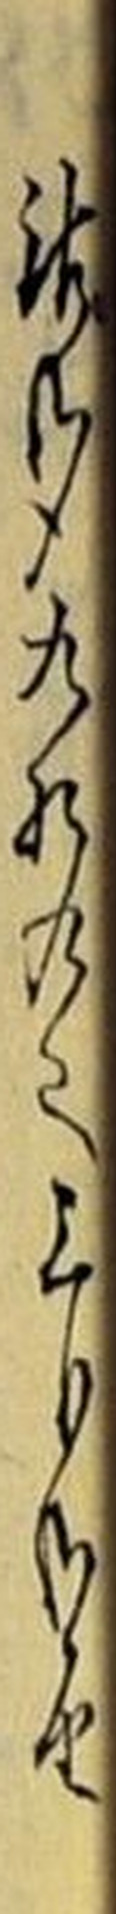銀弐貫九拾九匁三分弐厘
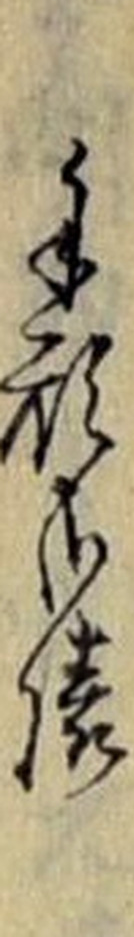手形弐俵
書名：命令之部 六
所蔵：福井県文書館 Fukui Prefectural Archives
